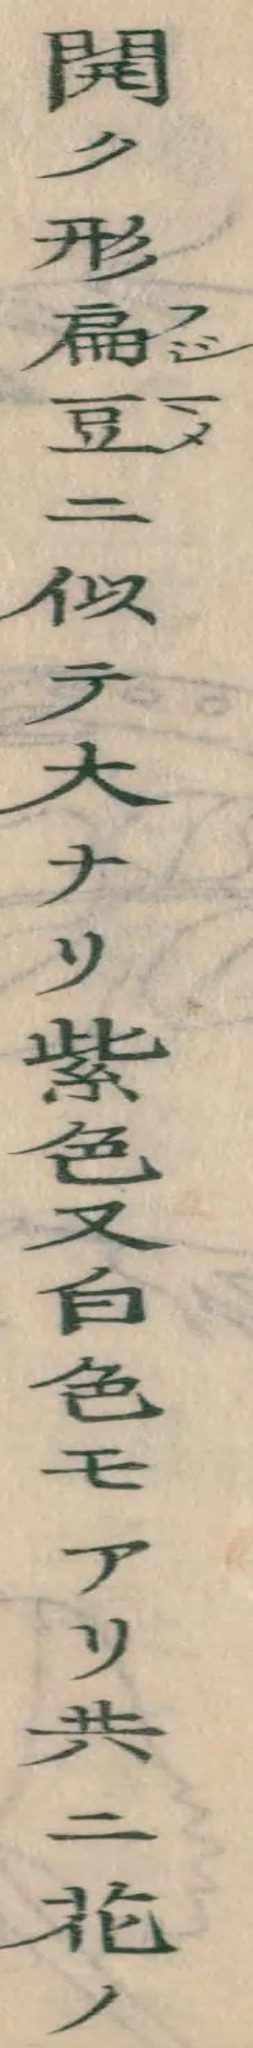開ク形扁豆ニ似テ大ナリ紫色又白色モアリ共ニ花ノ
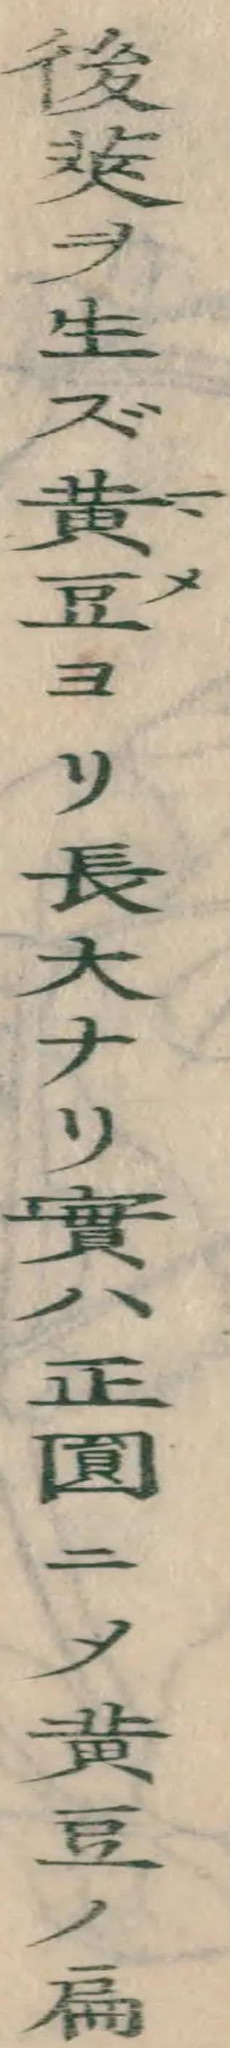後莢ヲ生ズ黄豆ヨリ長大ナリ実ハ正円ニシテ黄豆ノ扁
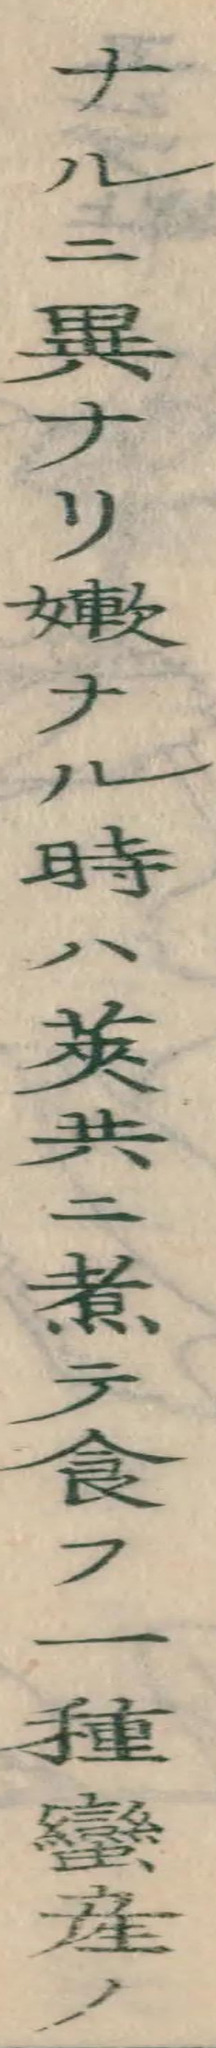ナルニ異ナリ嫩ナル時ハ莢共ニ煮テ食フ一種蛮産ノ
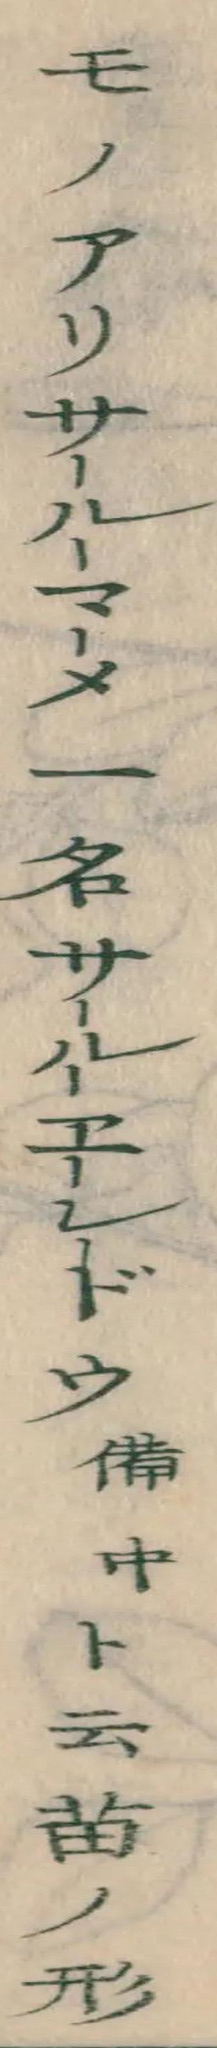モノアリサ-ル-マ-メ一名サ-ル-ヱ-ン-ド[-]ウ備中ト云苗ノ形
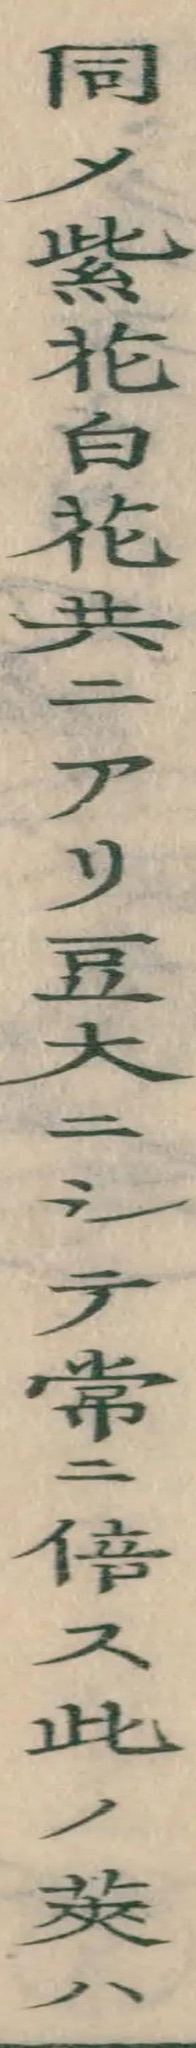同シテ紫花白花共ニアリ豆大ニシテ常ニ倍ス此ノ莢ハ
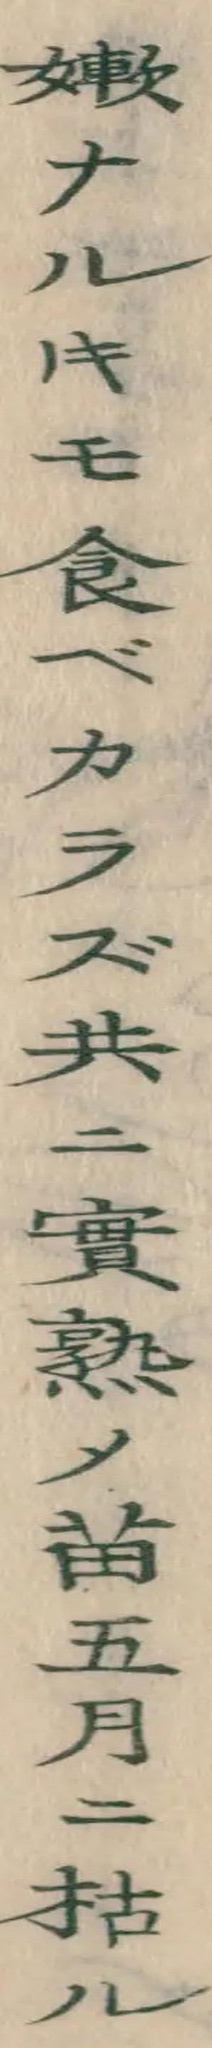嫩ナルトキモ食ベカラズ共ニ実熟シテ苗五月ニ枯ル
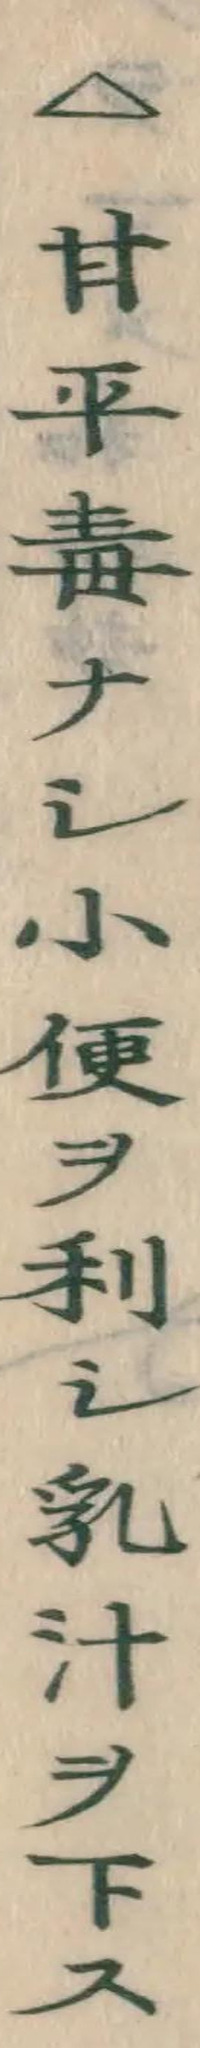△甘平毒ナシ小便ヲ利シ乳汁ヲ下ス

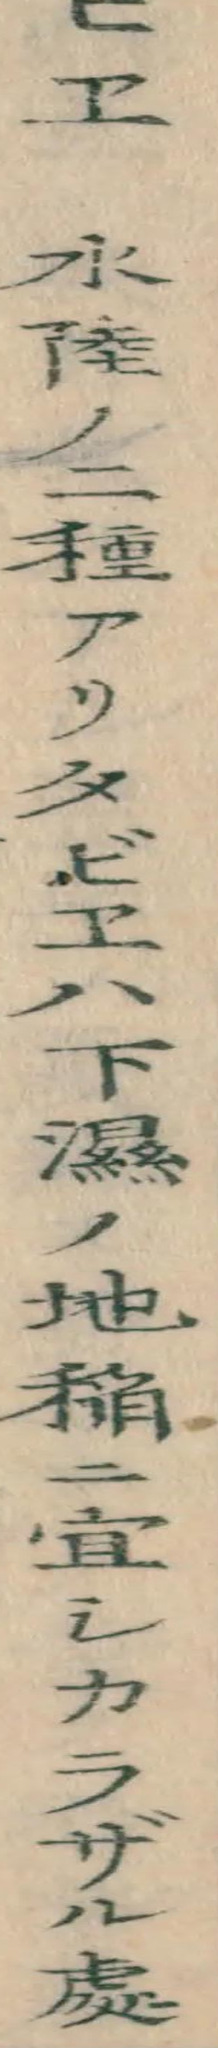ヒヱ水陸ノ二種アリタビヱハ下湿ノ地稲ニ宜シカラザル処
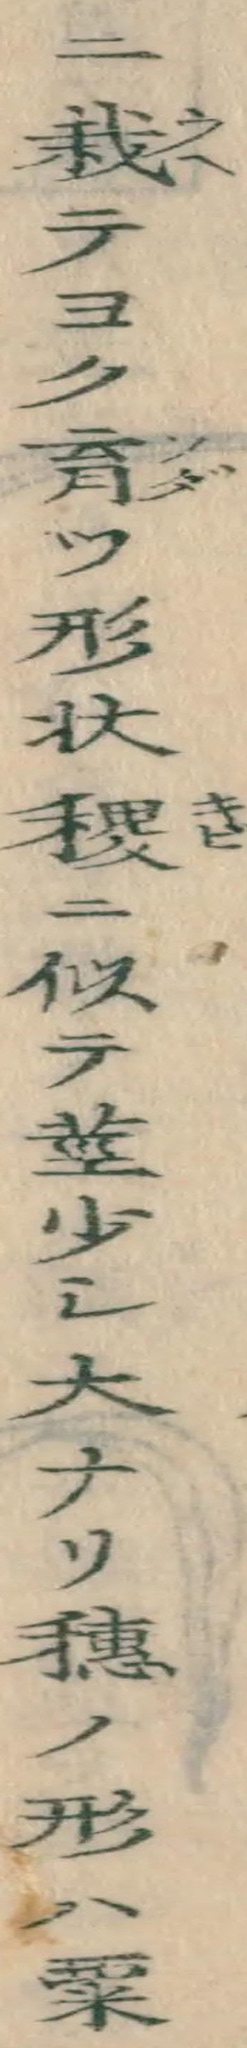ニ栽テヨク育ツ形状稷ニ似テ茎少シ大ナリ穂ノ形ハ粟
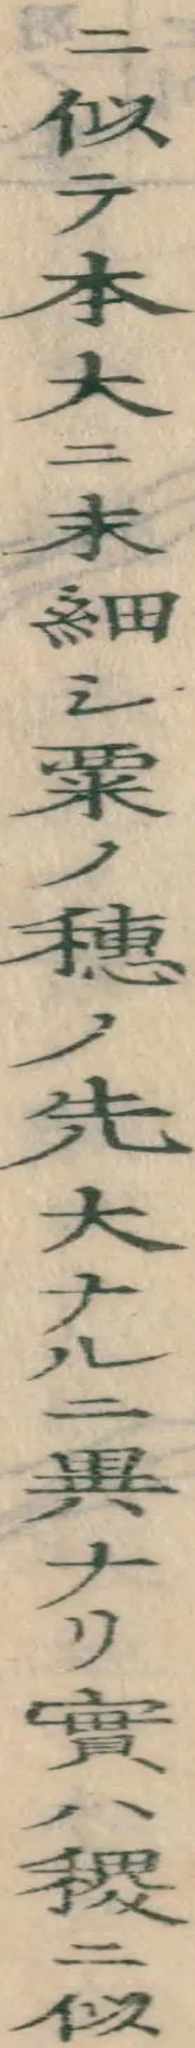ニ似テ本大ニ末細シ粟ノ穂ノ先大ナルニ異ナリ実ハ稷ニ似
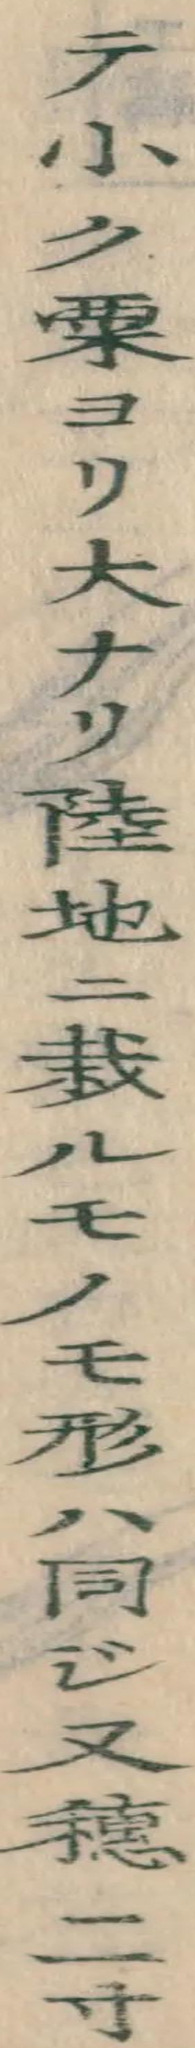テ小ク粟ヨリ大ナリ陸地ニ栽ルモノモ形ハ同ジ又穂二寸
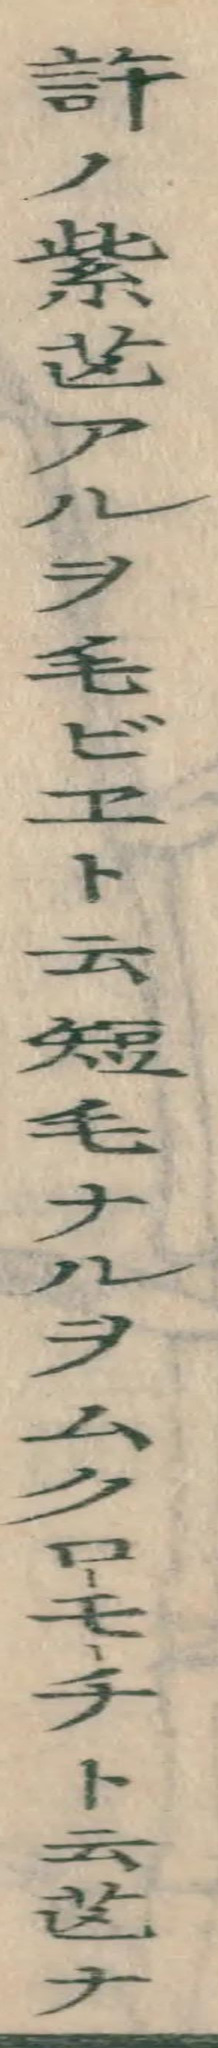許ノ紫芒アルヲ毛ビヱト云短毛ナルヲムクロ-モ-チト云芒ナ
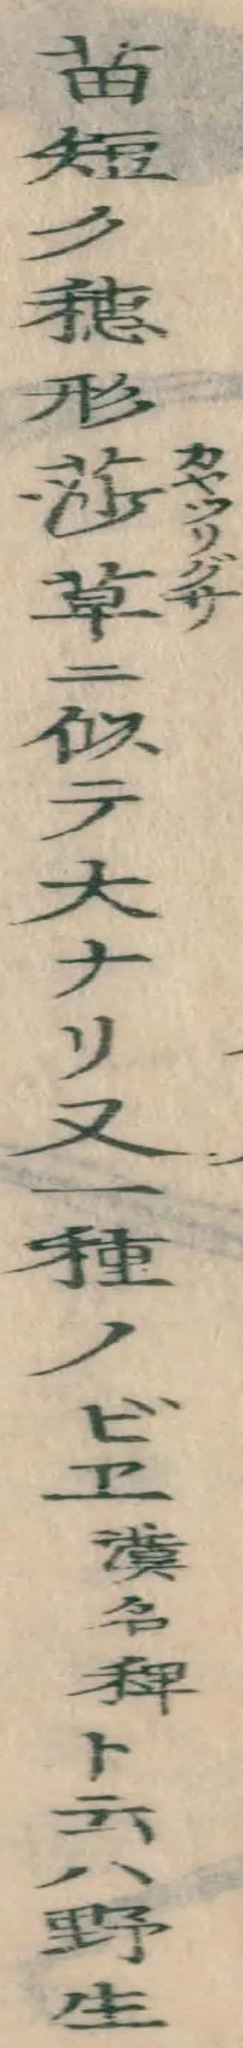苗短ク穂形莎草ニ似テ大ナリ又一種ノビヱ漢名稗ト云ハ野生
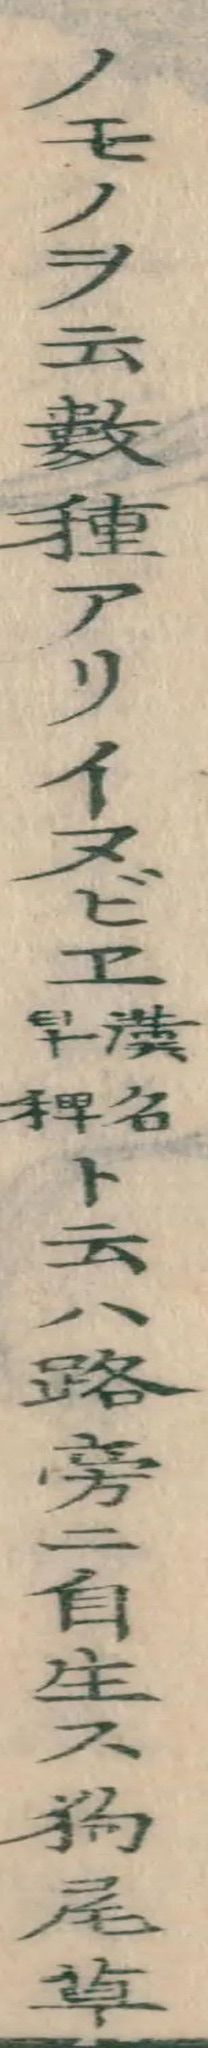ノモノヲ云数種アリイヌビヱ漢名旱稗ト云ハ路旁ニ自生ス狗尾草
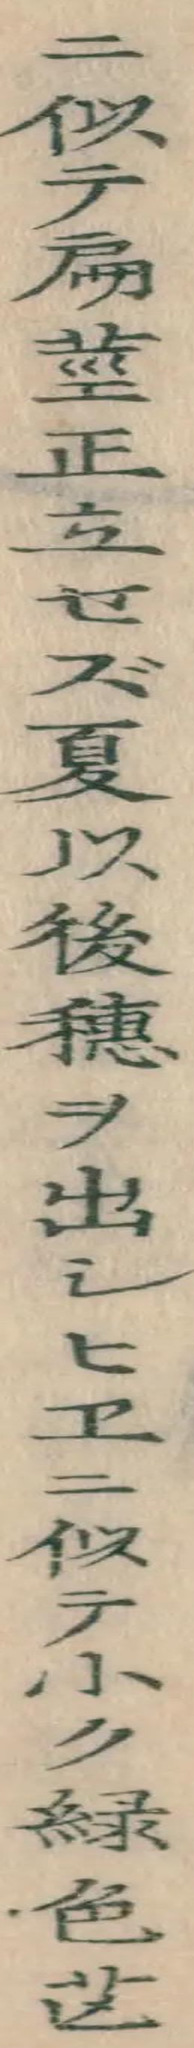ニ似テ扁茎正立セズ夏以後穂ヲ出シヒヱニ似テ小ク緑色芒
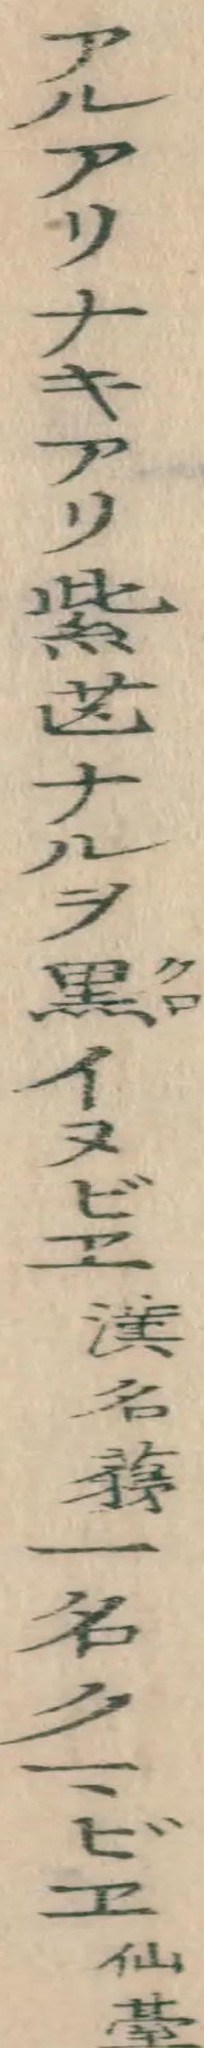アルアリナキアリ紫芒ナルヲ黒イヌビヱ漢名一名クマビヱ仙台
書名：これこれ草 2巻. [2]
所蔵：国立国会図書館 National Diet Library, JAPAN
